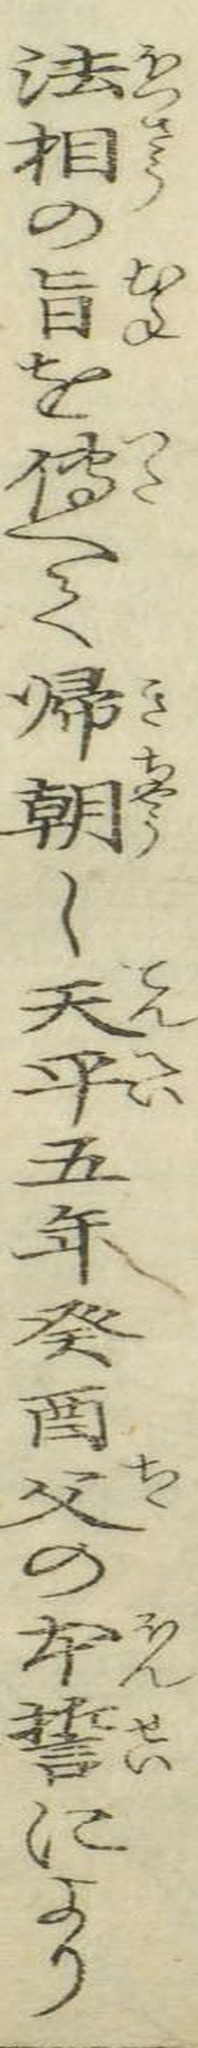法相の旨を傳へて帰朝し天平五年癸酉父の本誓により
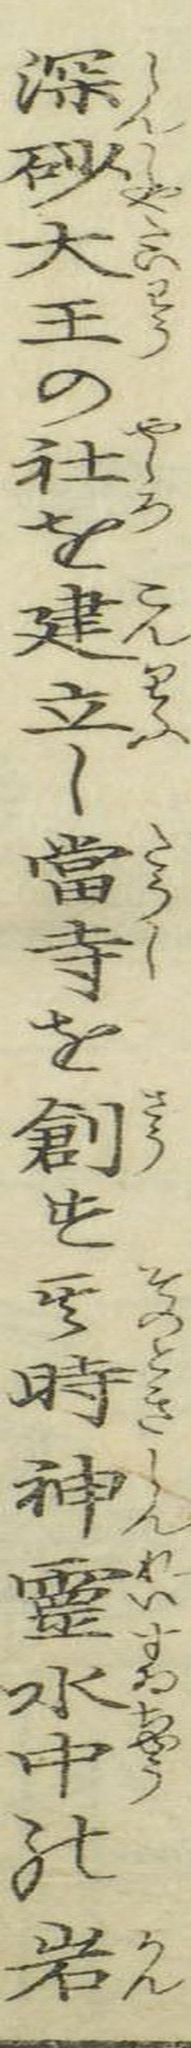深砂大王の社を建立し当寺を創す其時神霊水中の岩

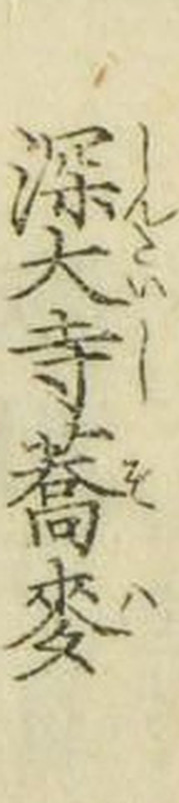深大寺蕎麦
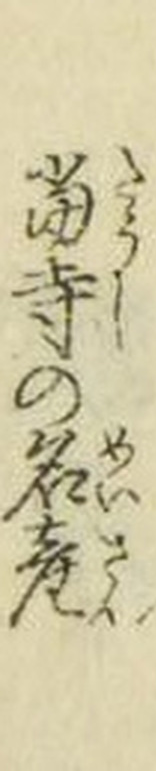当寺の名産
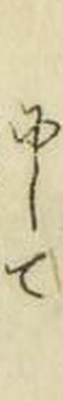にして
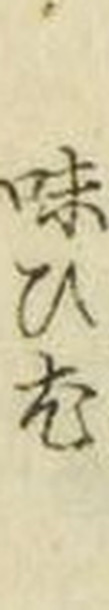味ひ尤
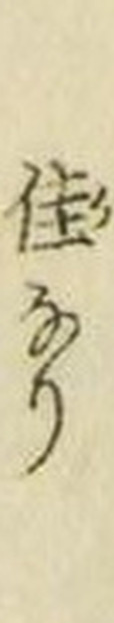佳なり
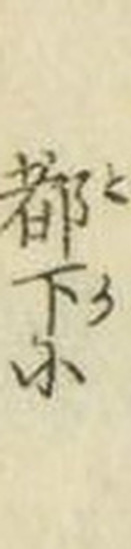都下に
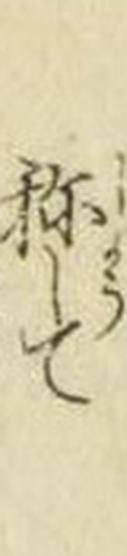称して
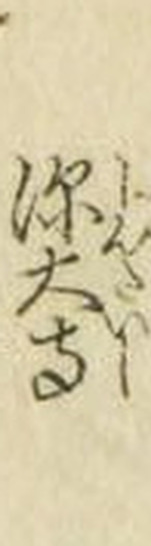深大寺
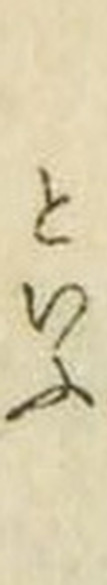といふ
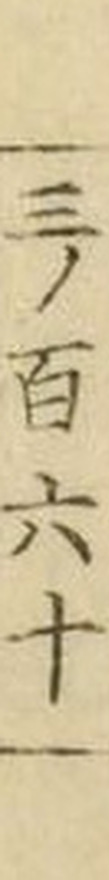三ノ百六十

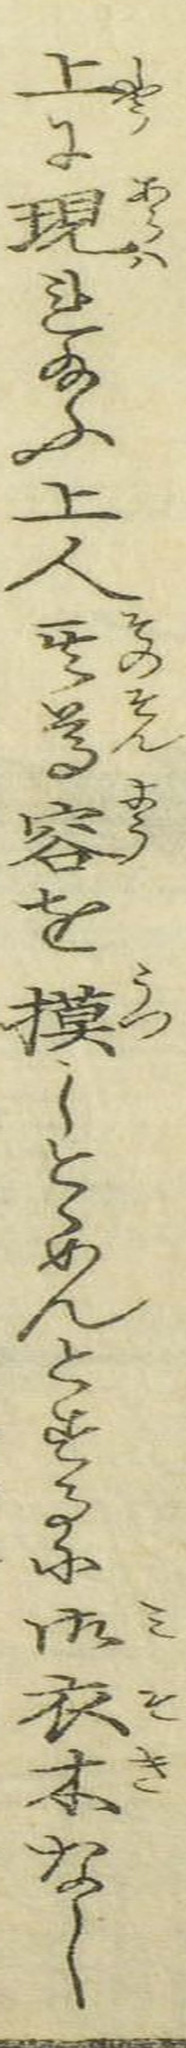上に現れ給ふ上人其尊容を摸しとゝめんとするに御衣木なし
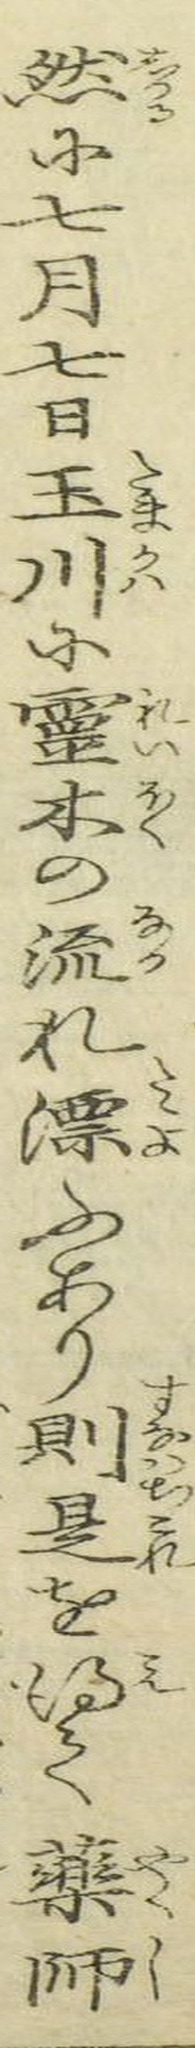然に七月七日玉川に霊木の流れ漂ふあり則是を得て薬師
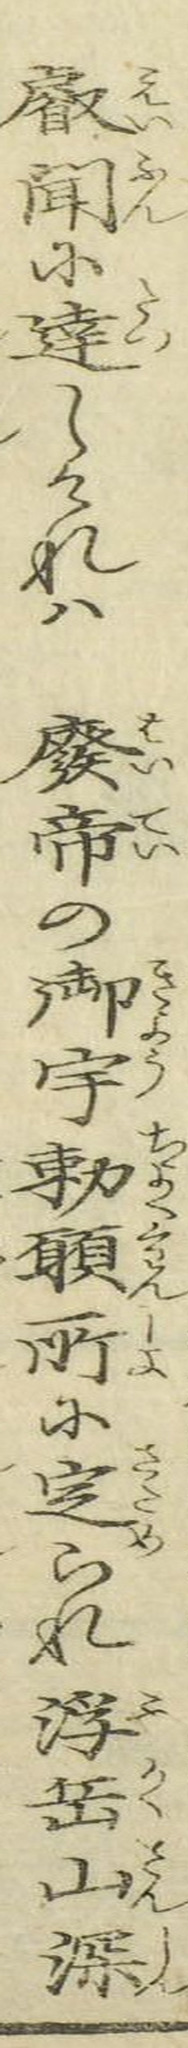叡聞に達しけれは廃帝の御宇勅願所に定られ浮岳山深
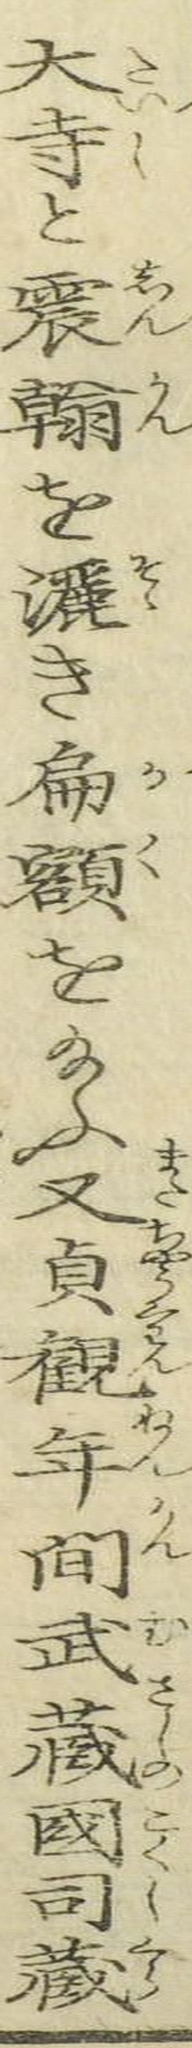大寺と震翰を灑き扁額を給ふ又貞観年間武蔵国司蔵
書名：江戸名所図会 20巻 巻之9
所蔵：東京学芸大学教育コンテンツアーカイブ
